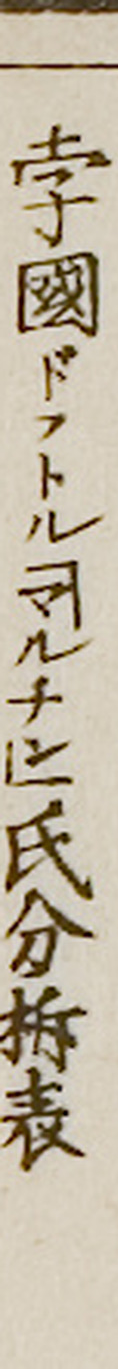孛国ドフトル「マルチン」氏分析表
